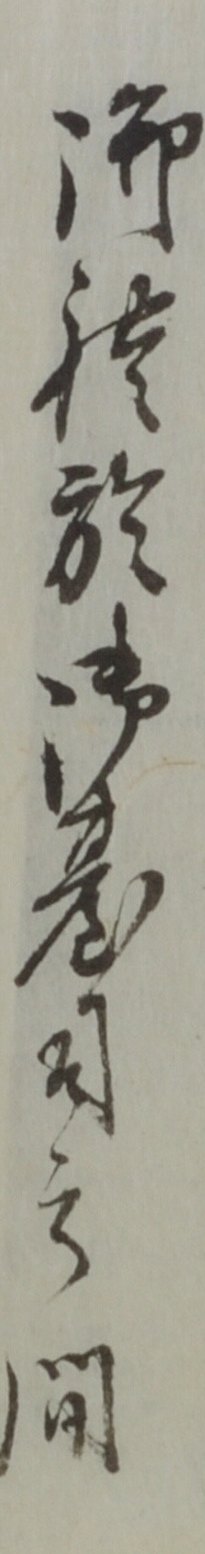御礼於御台司之間
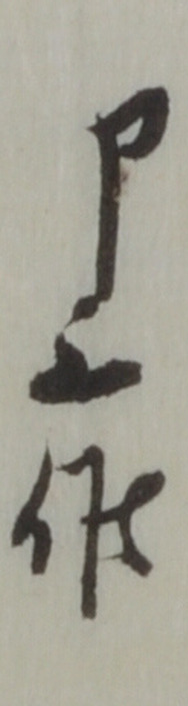申上候
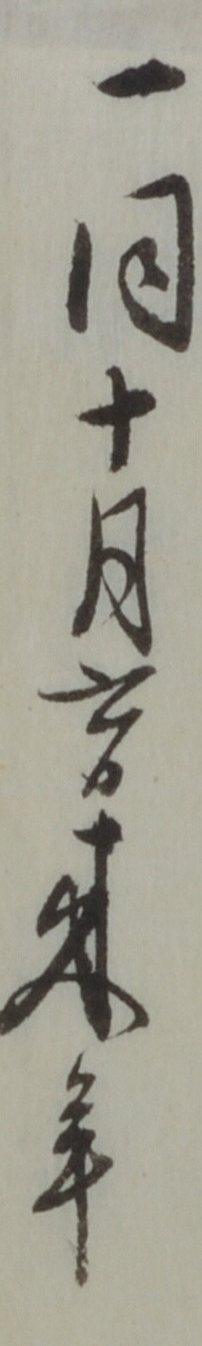一同十月六日来年
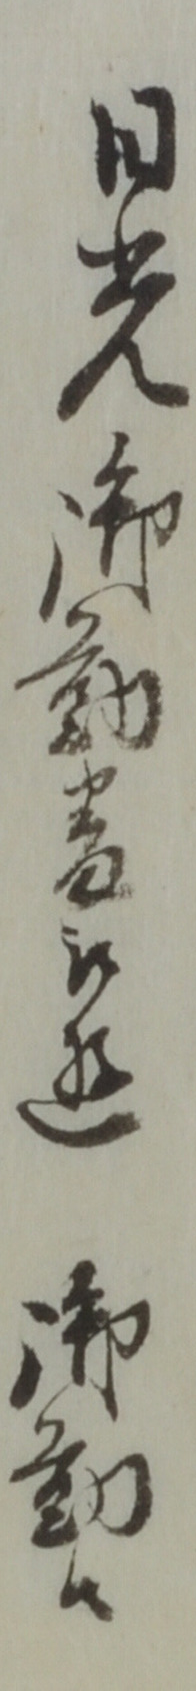日光御勘当被遊御勤候
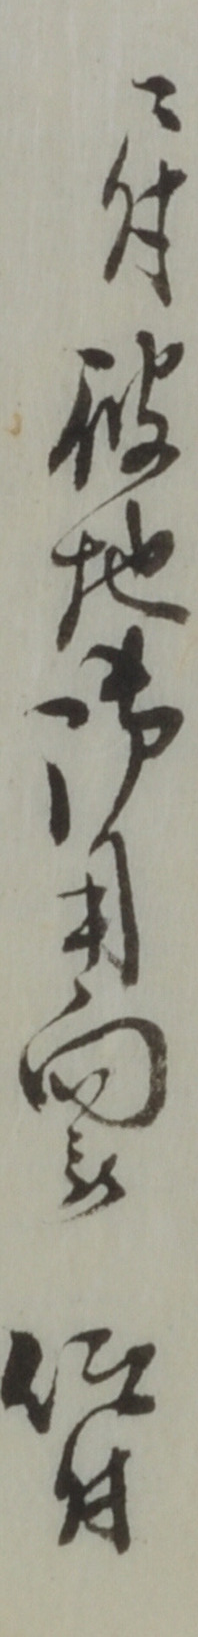ニ付彼地御用向被仰付
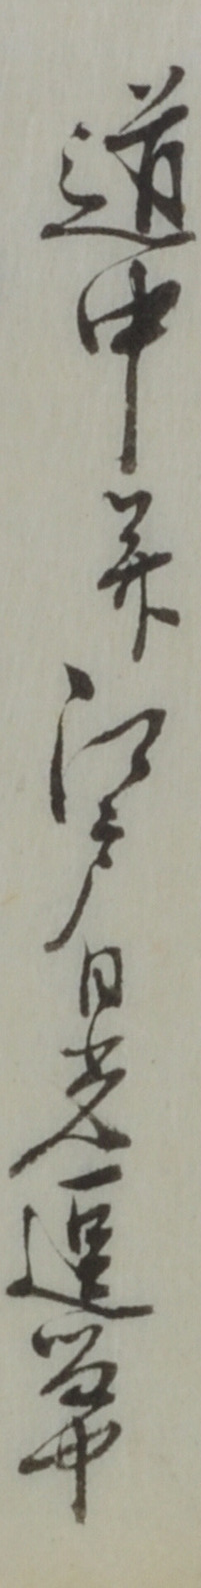道中并江戸日光逗留中
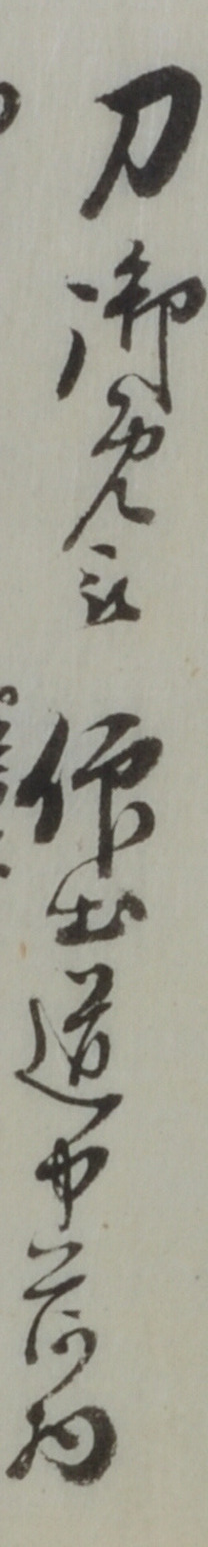刀御免被仰出道中荷物
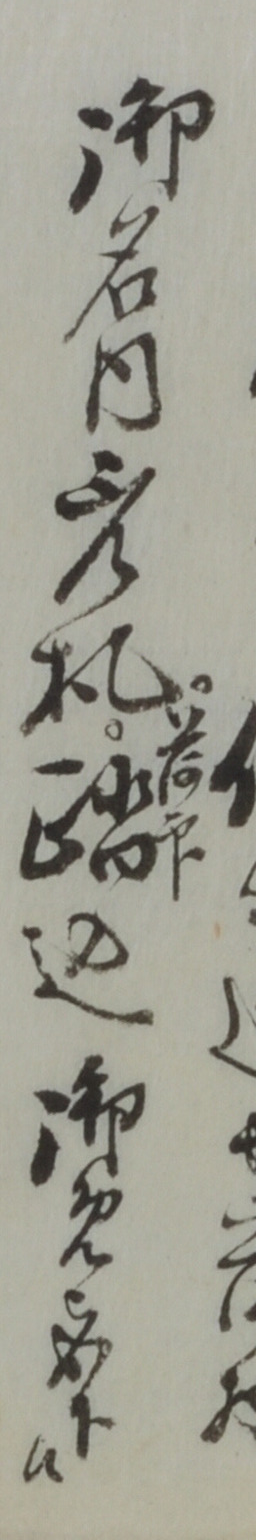御名内差札荷印踏込御免被成下候
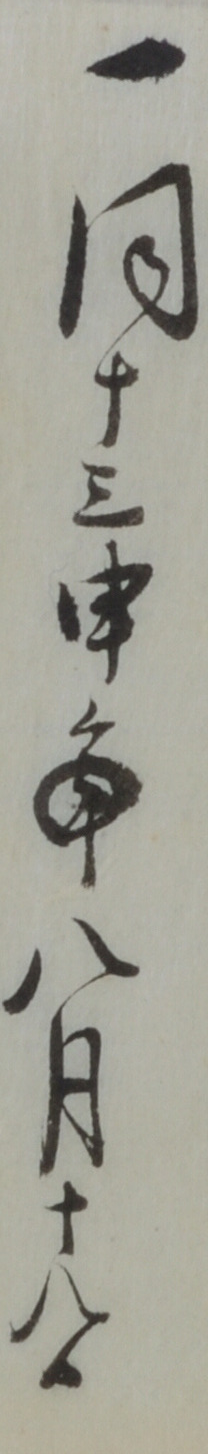一同十三申年八月十八日
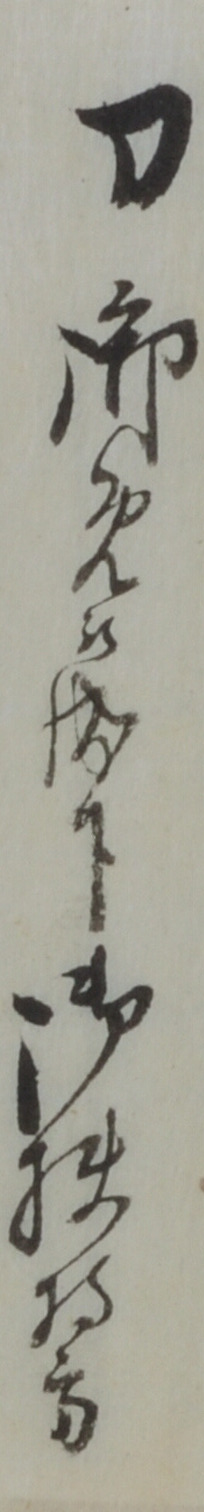刀御免被成下御扶持方
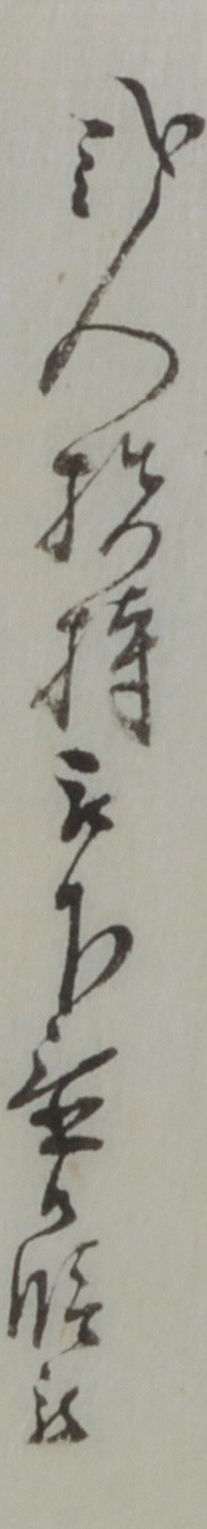弐人扶持被下置候段被
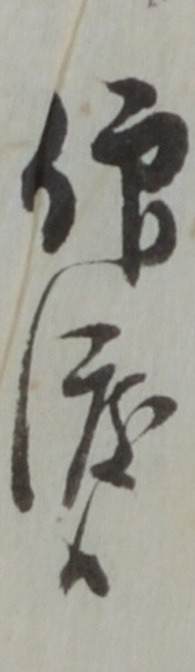仰渡候

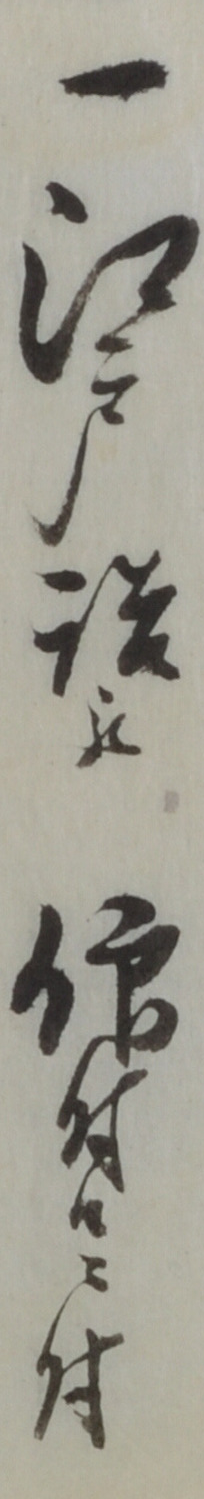一江戸詰被仰付候ニ付
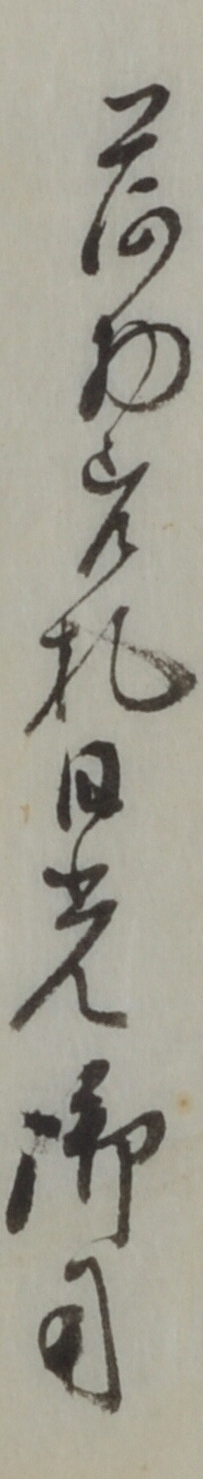荷物差札日光御用
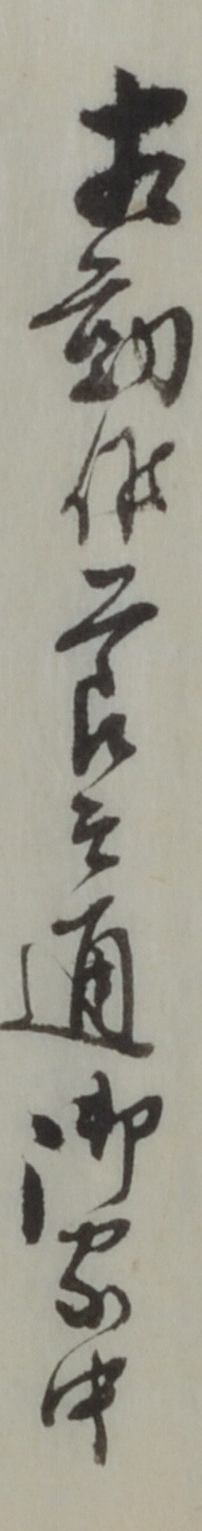相勤候節之通御家中
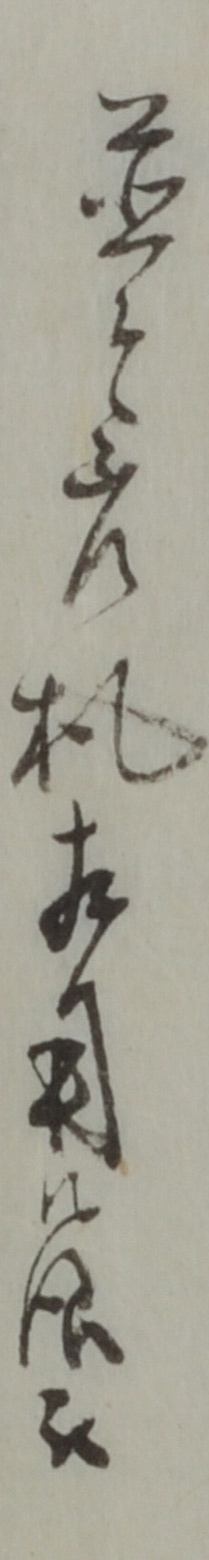並と差札相用候様被
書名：抜書
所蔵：伊那市立高遠町図書館・合同会社AMANE
